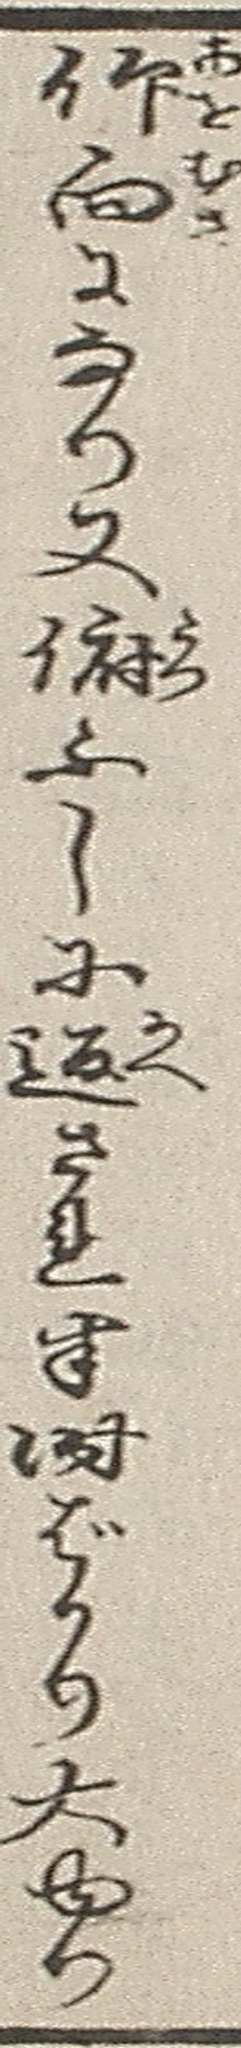仰向になり又俯ふしに返され半時ばかり大ゆり
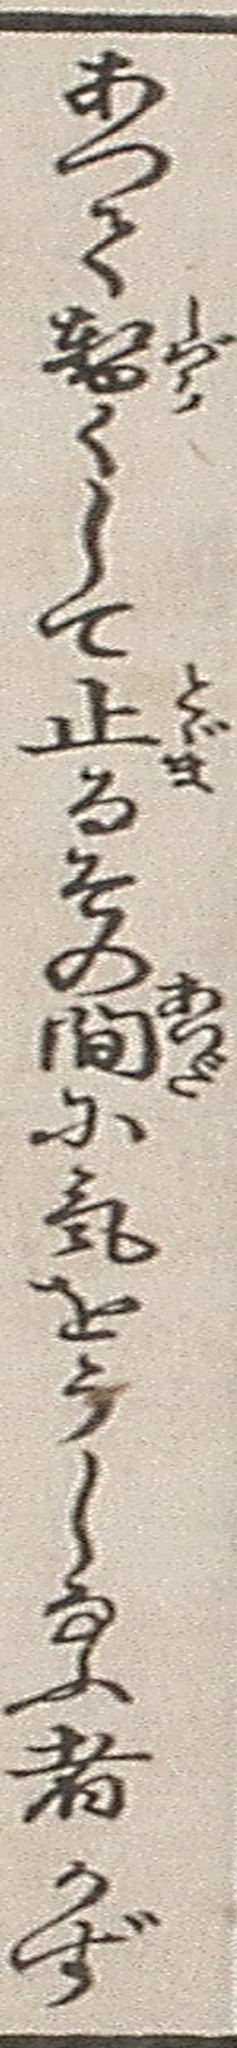あつて暫くして止るその間に気をうすなふ者かず
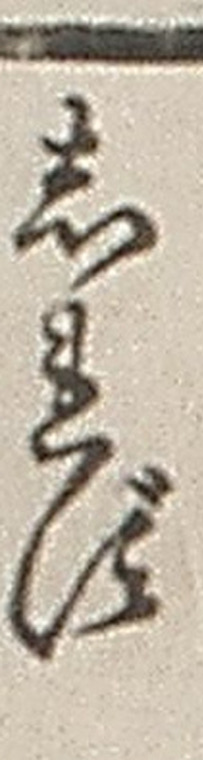しれず
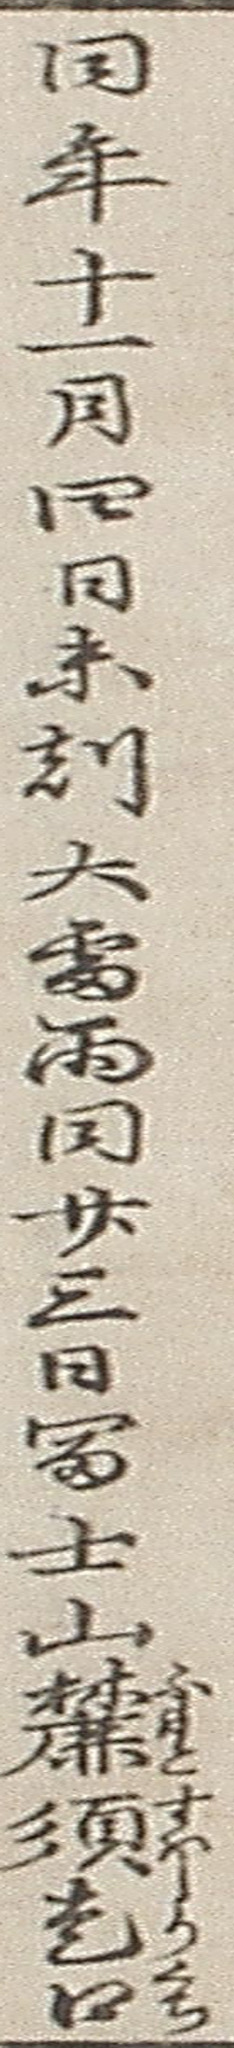同年十一月四日未刻大雷雨同廿三日富士山麓須走口
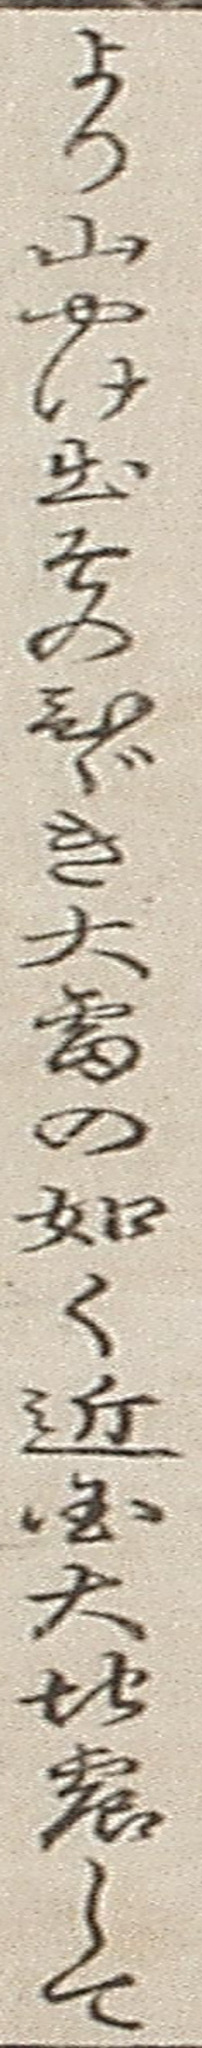より山やけ出そのひゞき大雷の如く近国大地震して
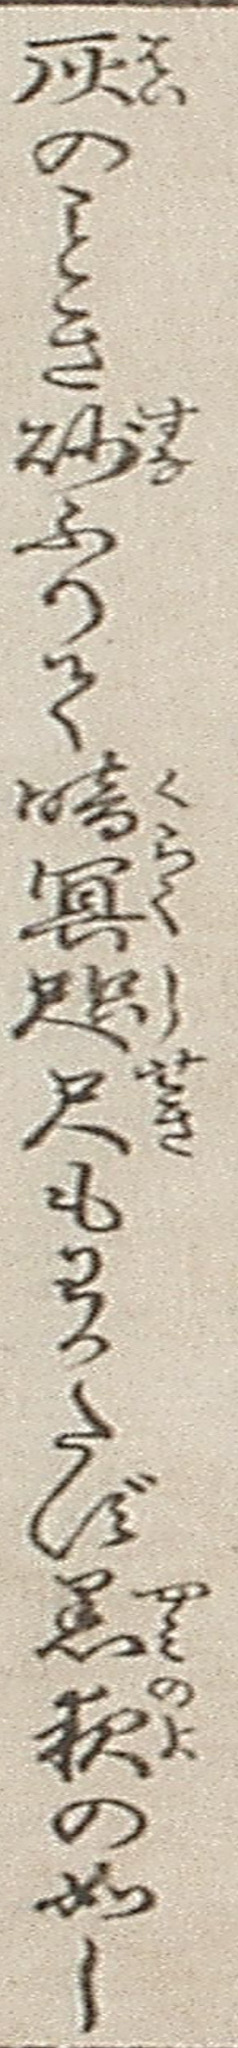灰のことき砂ふりて暗冥咫尺もわかたず黒夜の如し
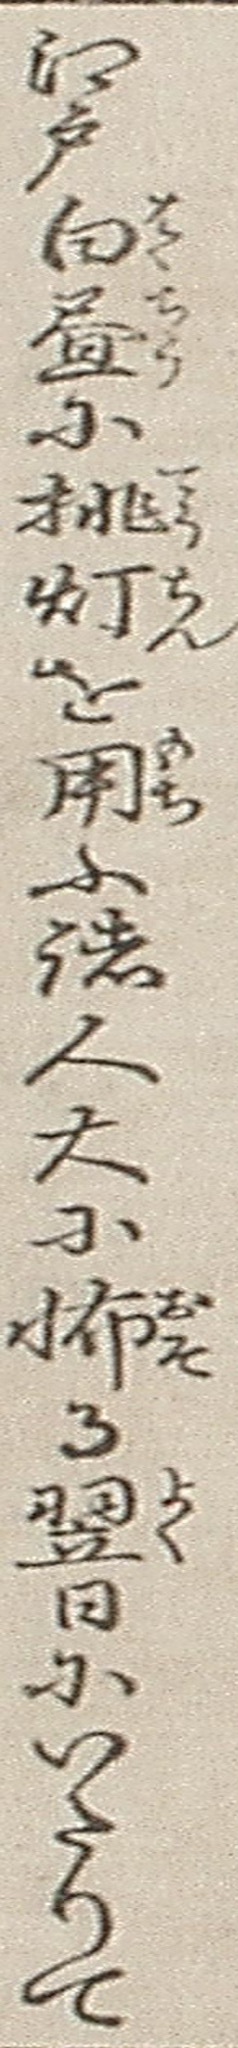江戸白昼に挑灯を用ふ諸人大に怖る翌日にいたりて

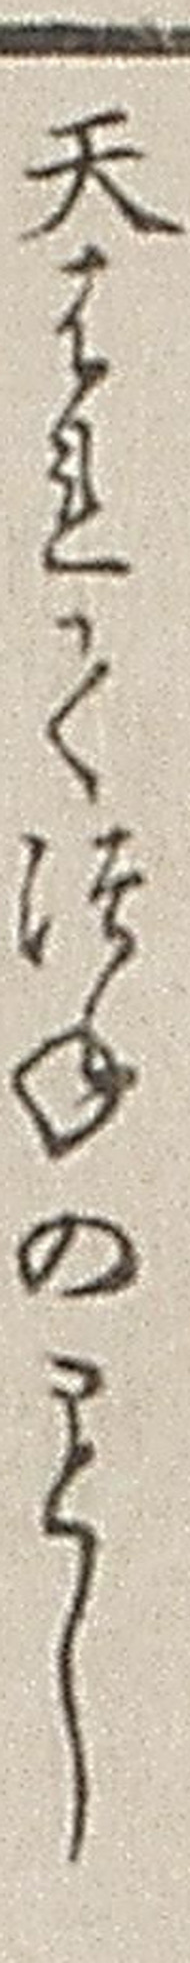天はれてつねのことし
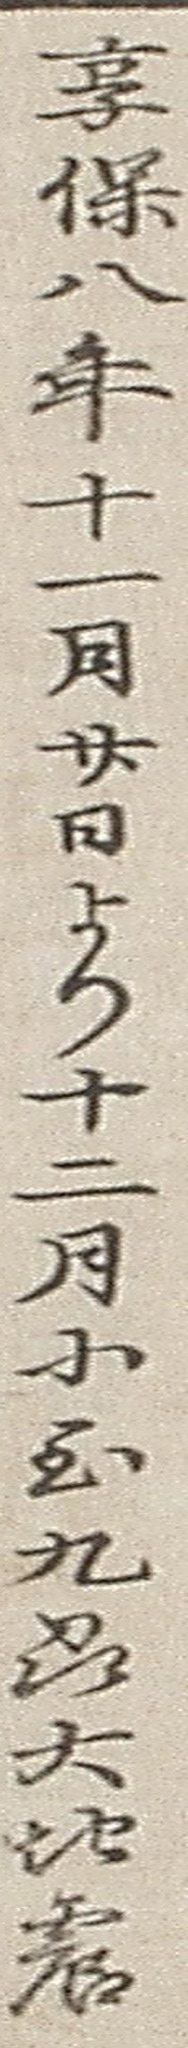享保八年十一月廿日より十二月に至九州大地震
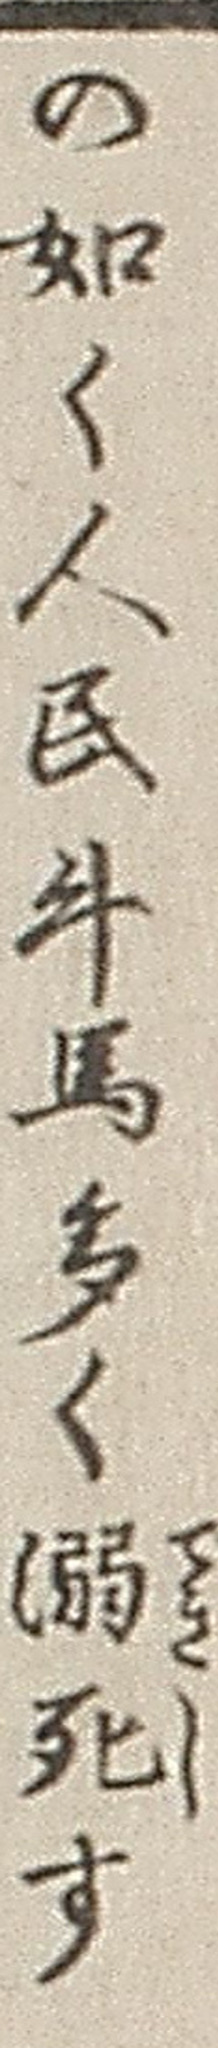の如く人民牛馬多く溺死す
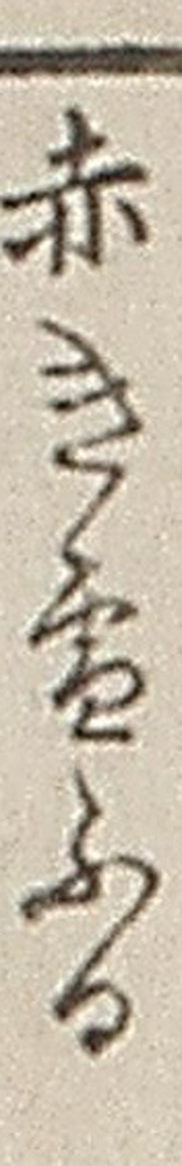赤き雪ふる
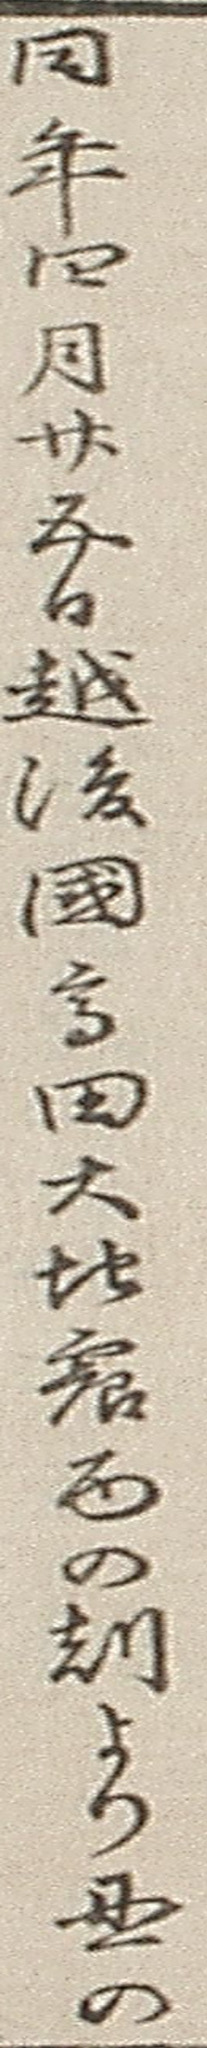同年四月廿五日越後国高田大地震酉の刻より丑の
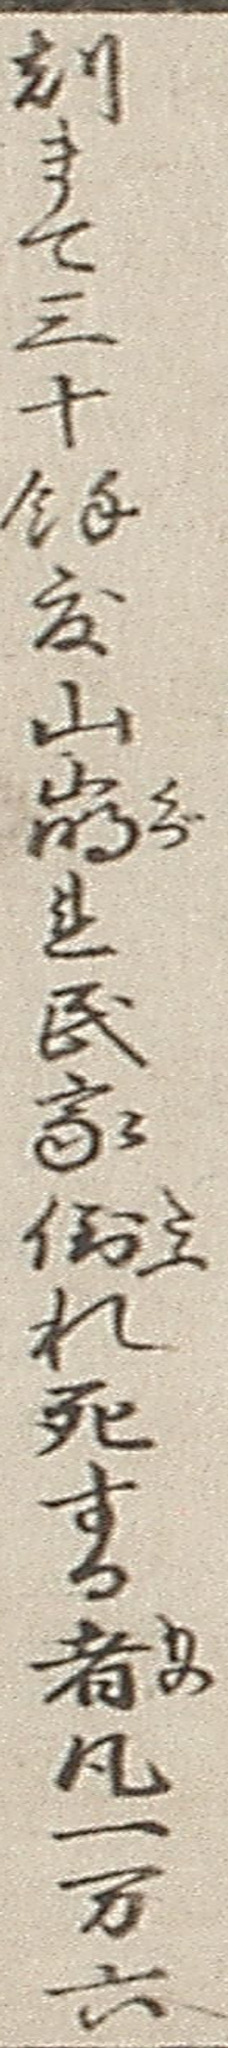刻まて三十餘度山崩れ民家倒れ死する者凡一万六

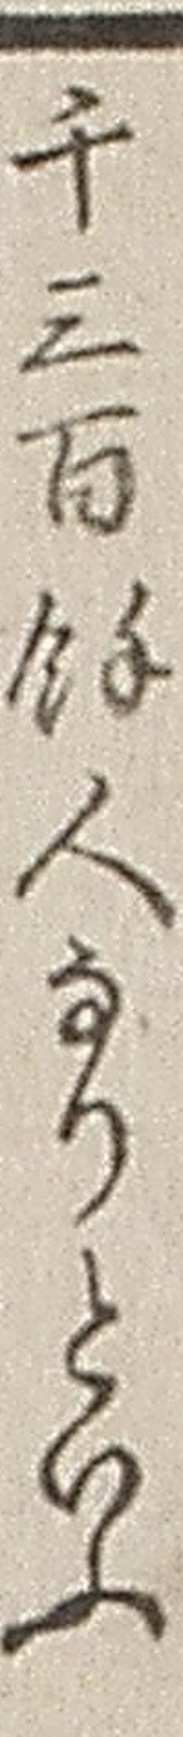千三百余人なりといふ
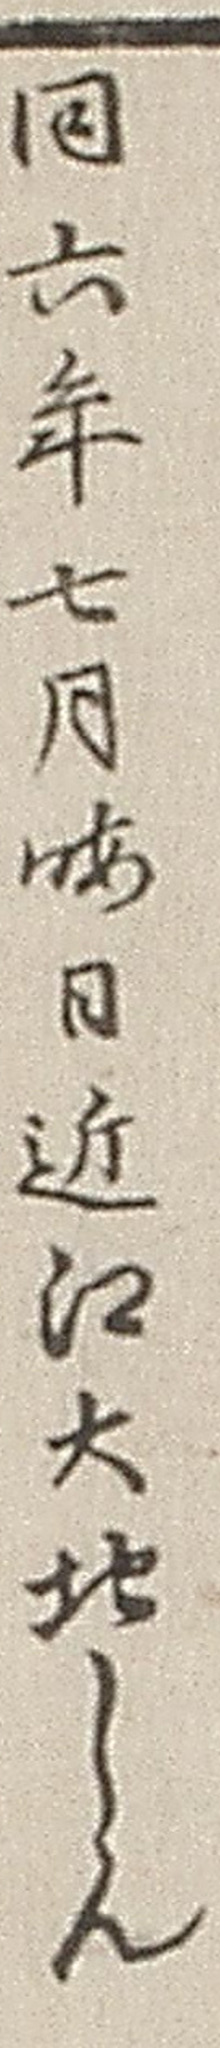同六年七月晦日近江大地しん
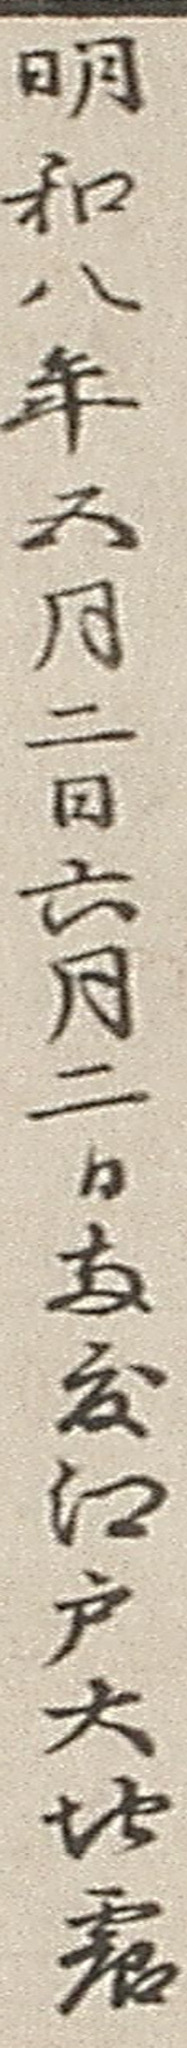明和八年五月二日六月二日両度江戸大地震
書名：大地震暦年考　全
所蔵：東京大学地震研究所図書室 Earthquake Research Institute Library, The University of Tokyo, JAPAN
